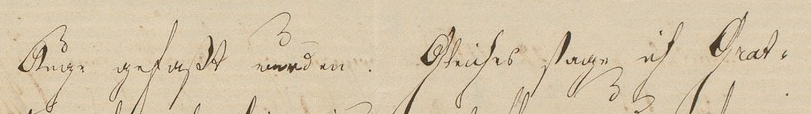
Auge gefaßt wurden. Gleiches sage ich Grat-
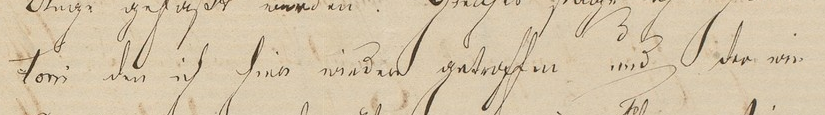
toni den ich hier wieder getroffen und der wie
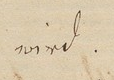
wird.
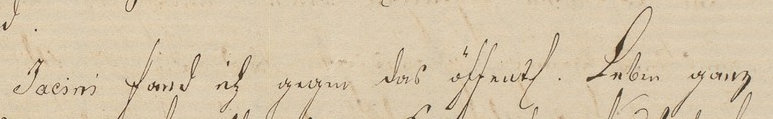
Jacini fand ich gegen das öffentl. Leben ganz
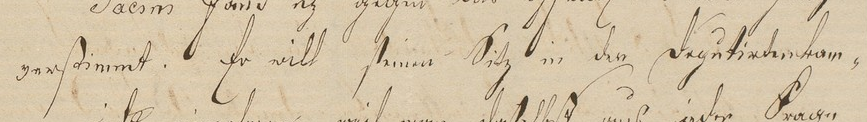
verstimmt. Er will seinen Sitz in der Deputirtenkam-
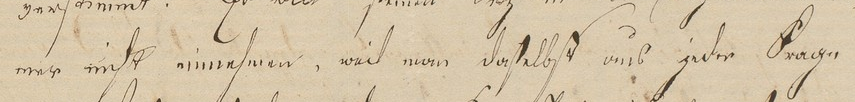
mer nicht einnehmen, weil man daselbst aus jeder Frage
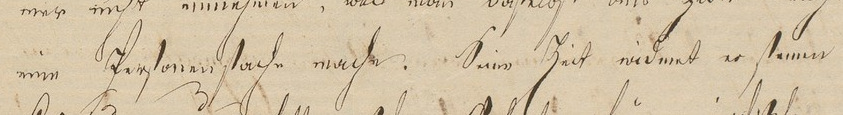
eine Personensache mache. Seine Zeit widmet er seinen
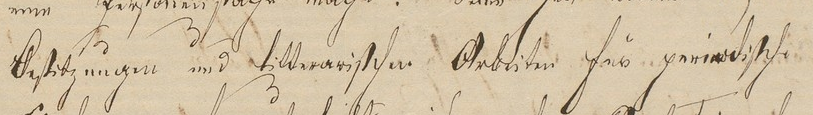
Besitzungen und litterarischen Arbeiten für periodische
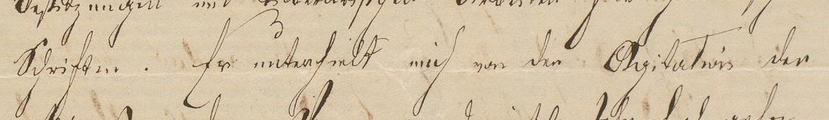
Schriften. Er unterhielt mich von der Agitation der
